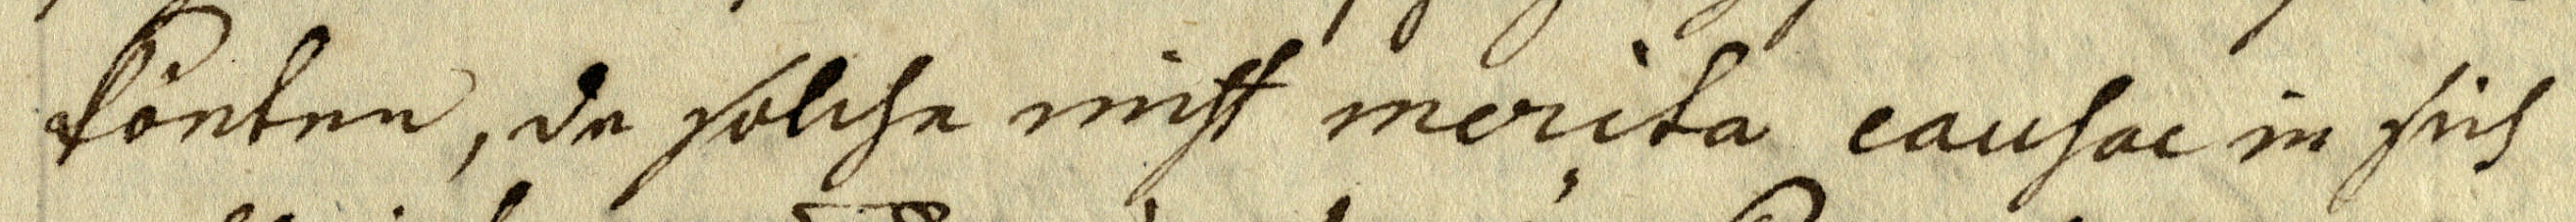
könten, da solche nicht merata causae in sich
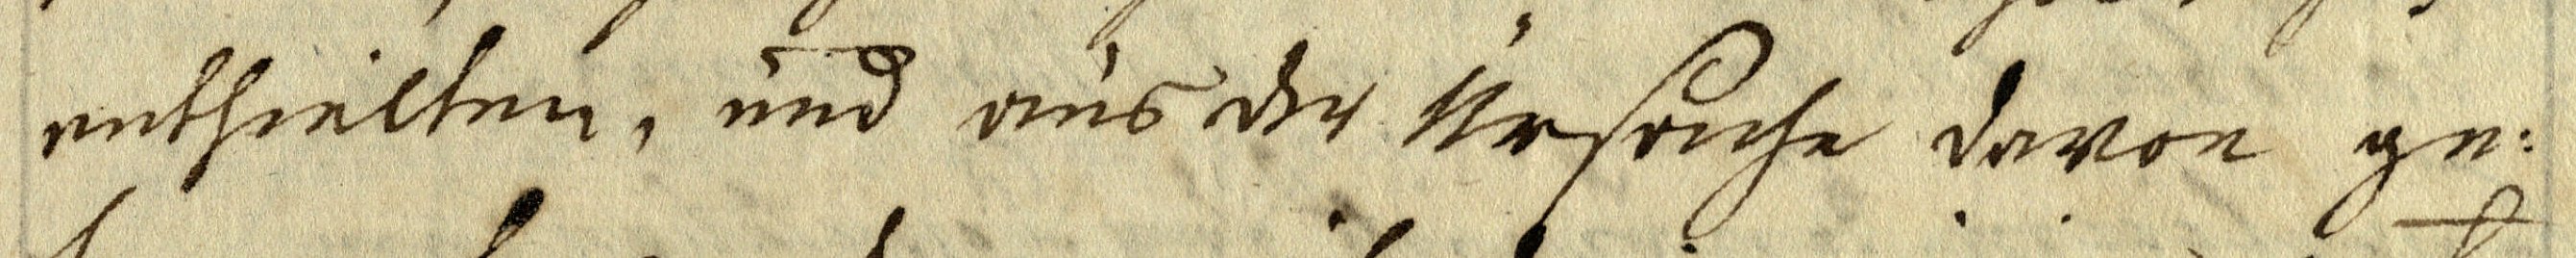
enthielten, und aus der Ursache davon ge¬
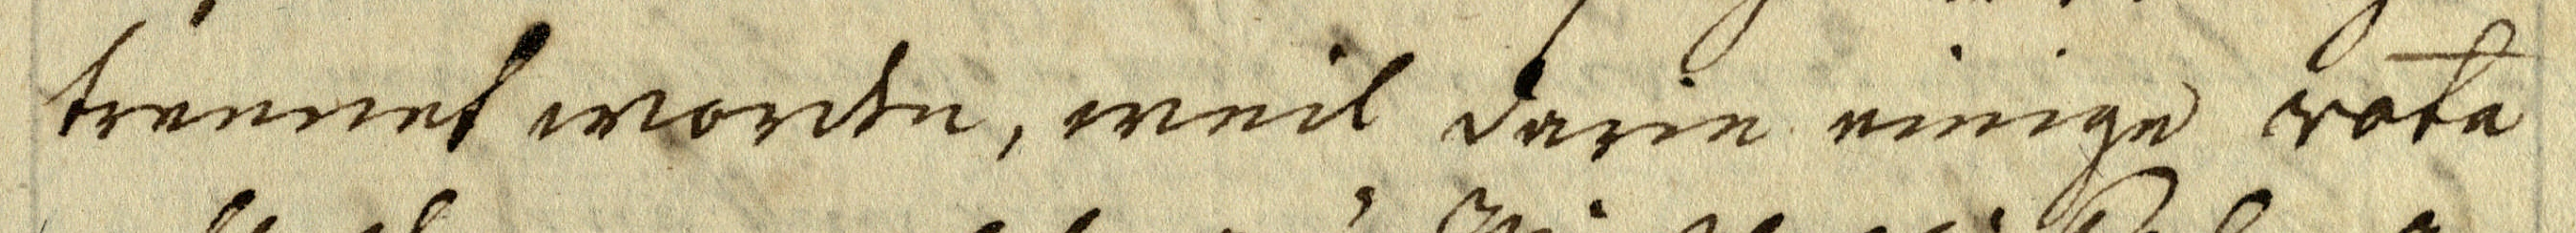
trennt worden, weil darin einige vota
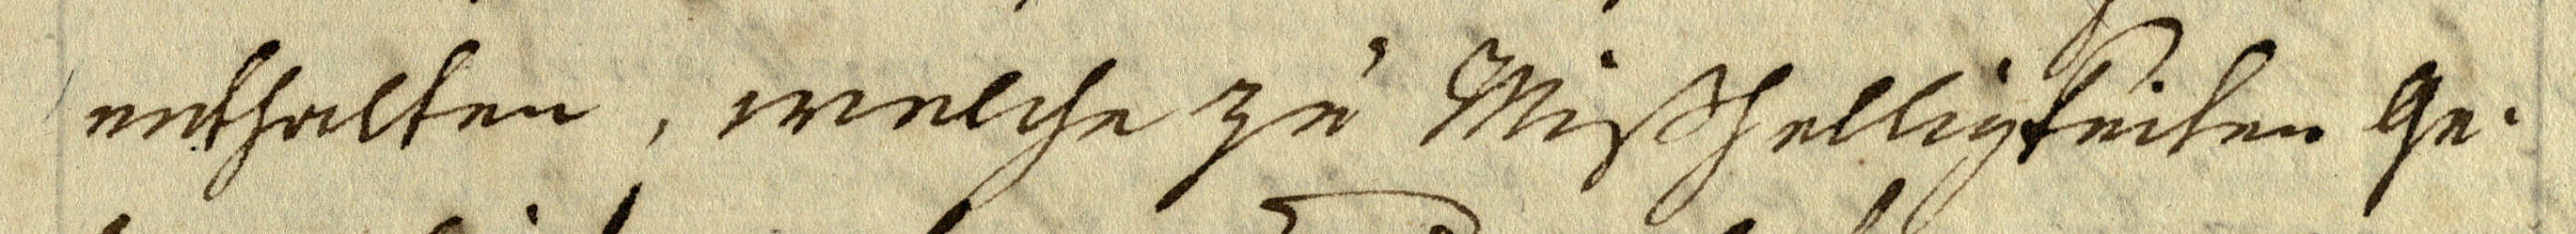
enthalten, welche zu Mißhelligkeiten Ge¬
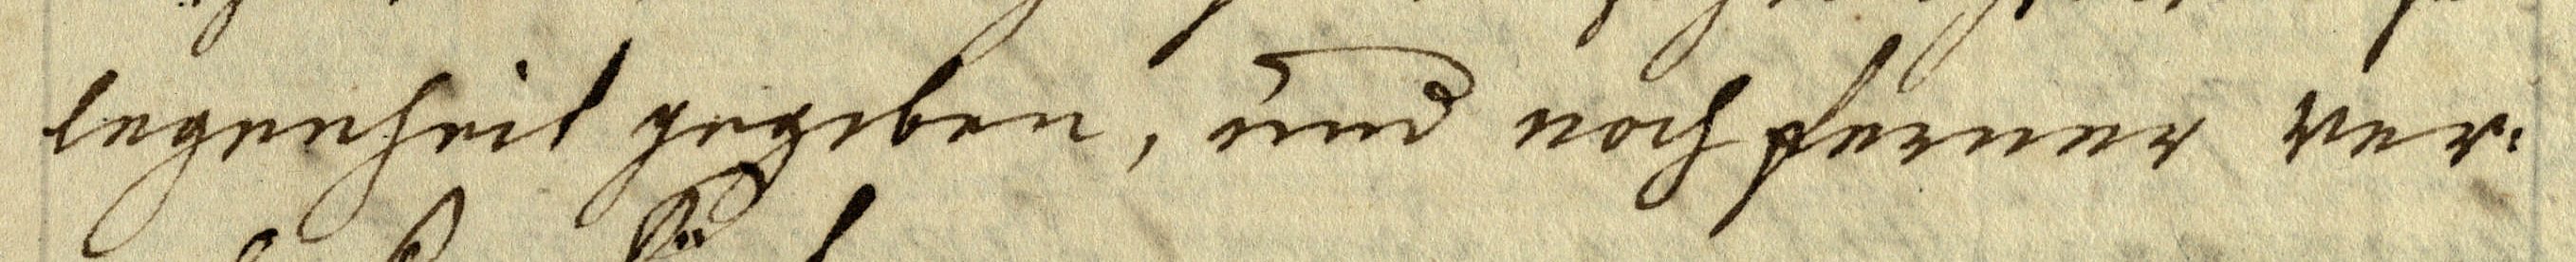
legenheit gegeben, und noch ferner ver¬
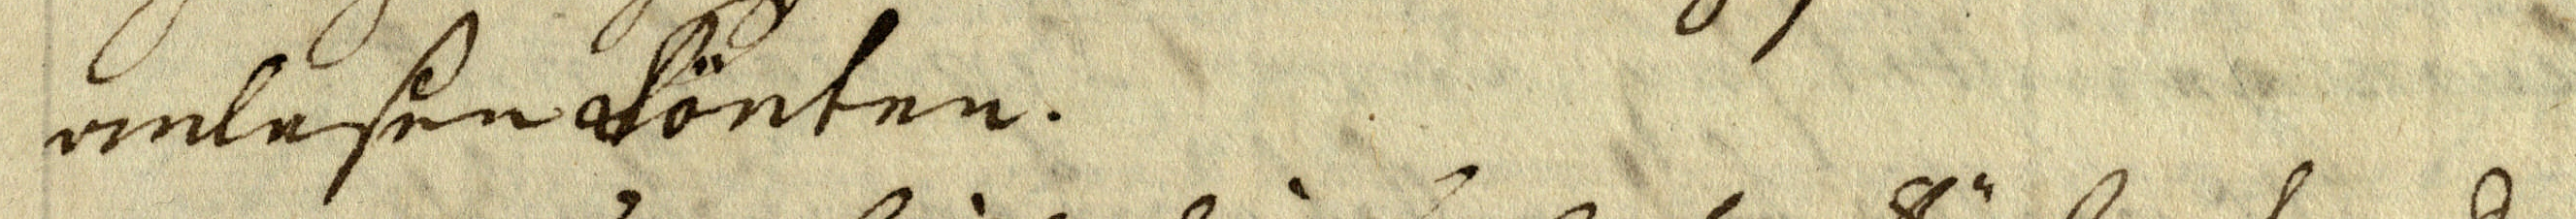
anlaßen könten.
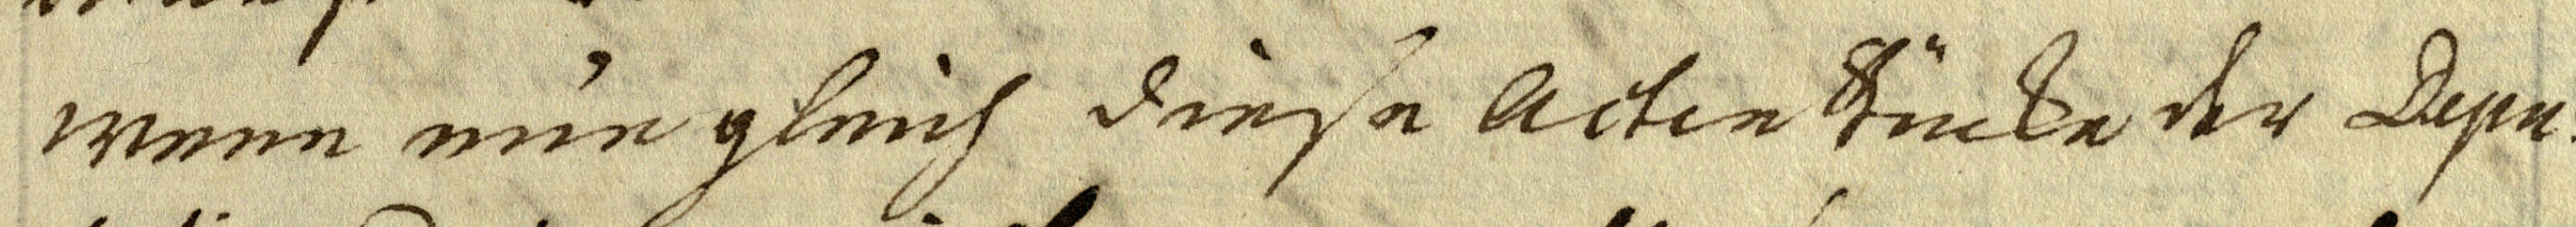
wenn nun gleich diese Acten Stücke der Depu¬
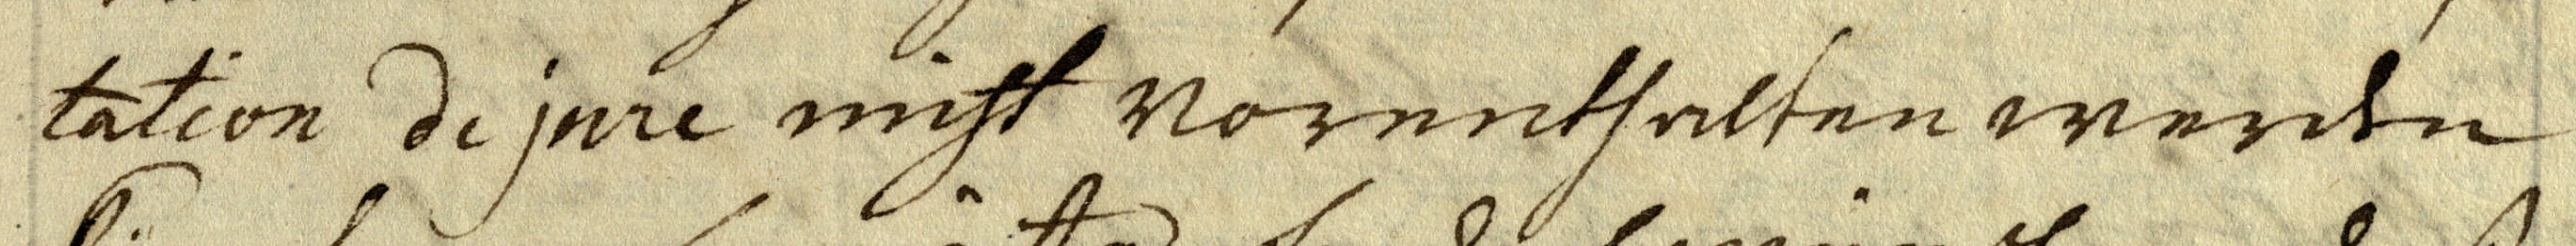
tation de jure nicht vorenthalten werden
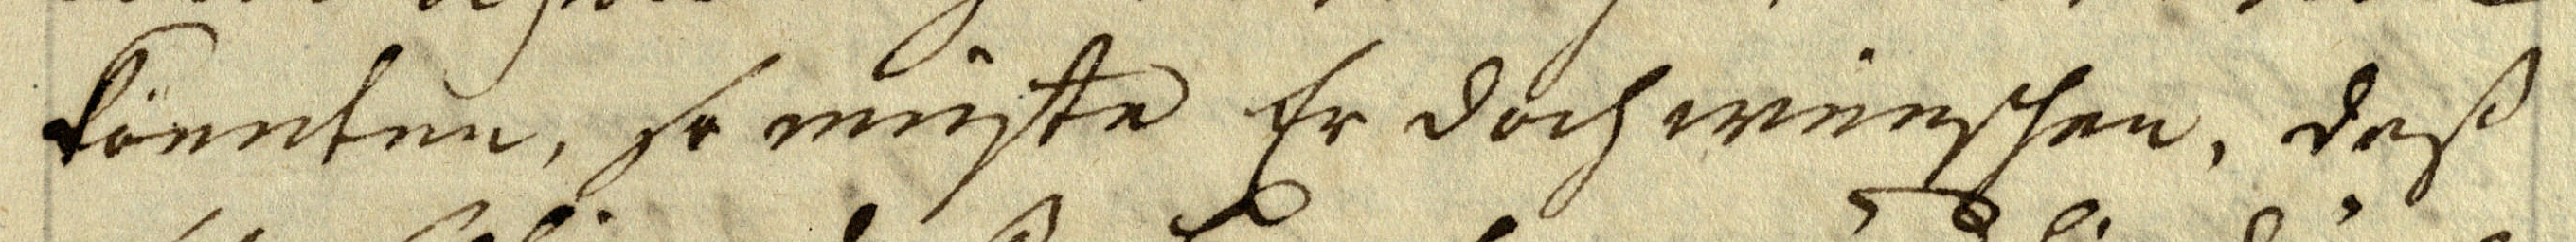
könnten, so müste Er doch wünschen, daß
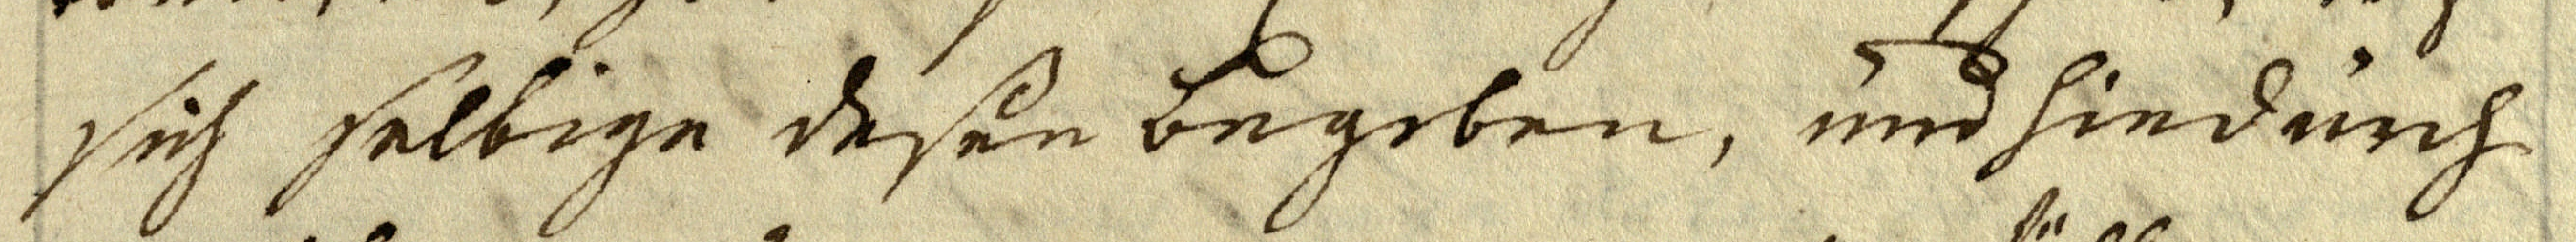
sich selbige deßen begeben, und hiedurch
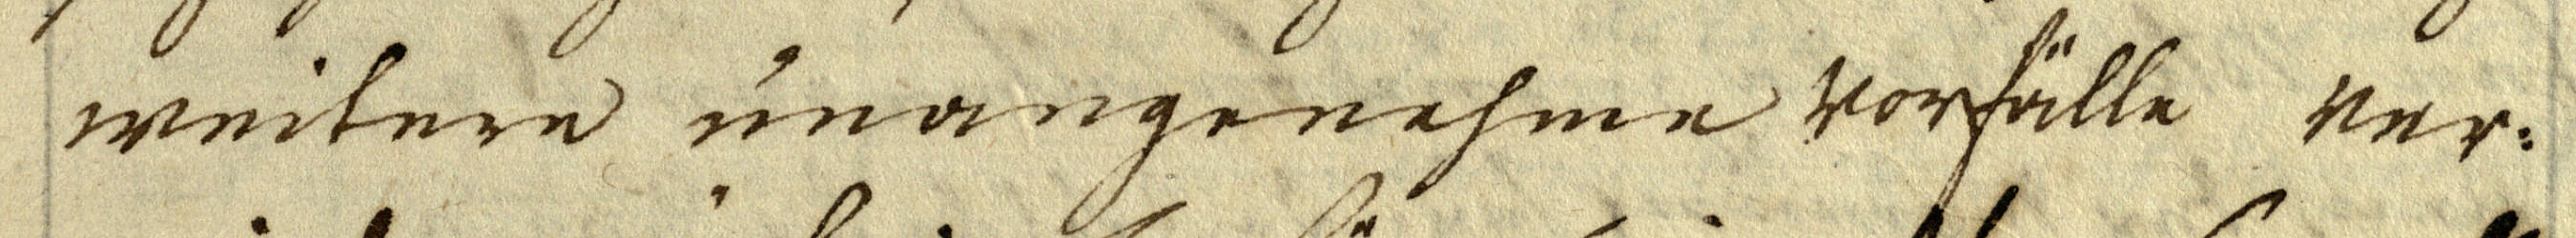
weitere unangenehme Vorfälle ver¬
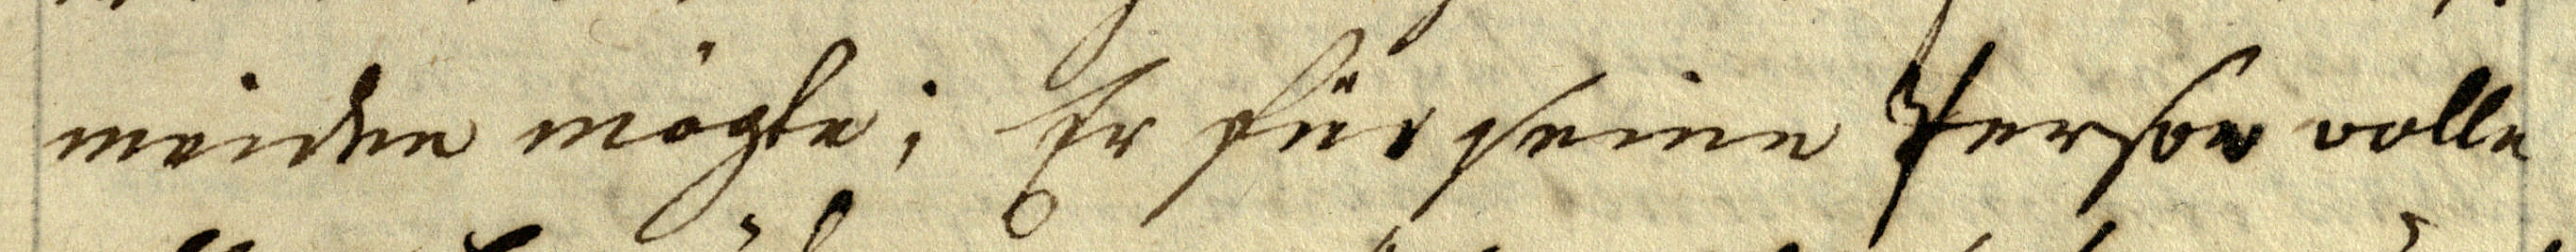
meiden mögte; Er für seine Person wolle
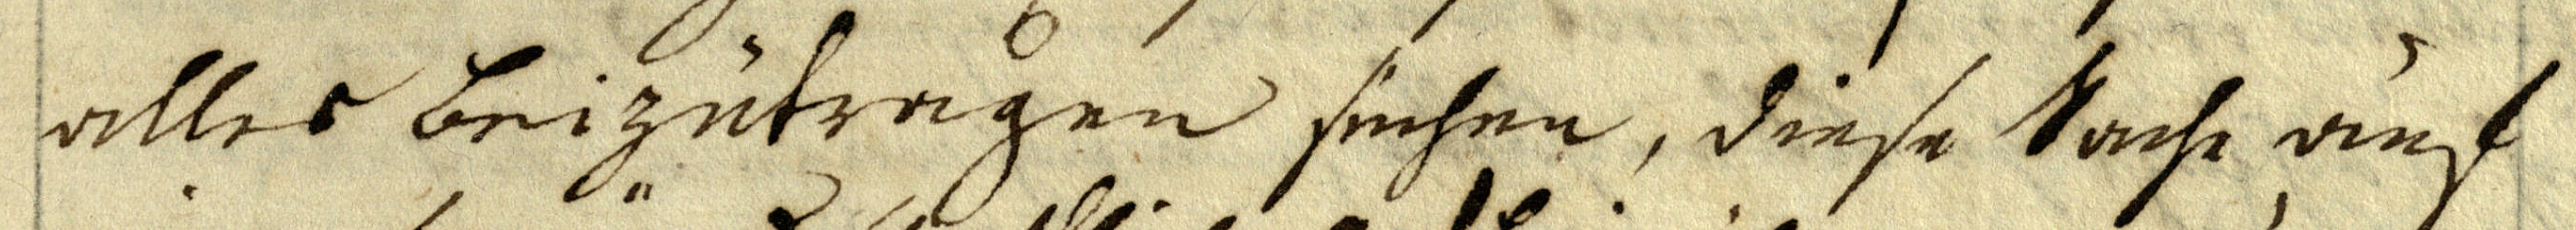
alles beizutragen suchen, diese Sache auf
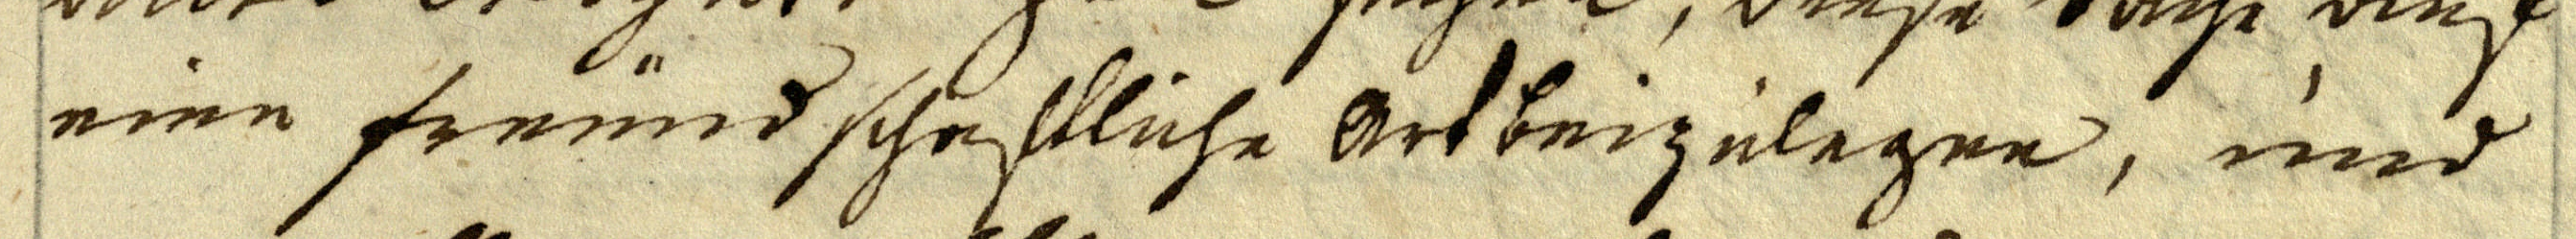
eine freundschaftliche Art beizulegen, und
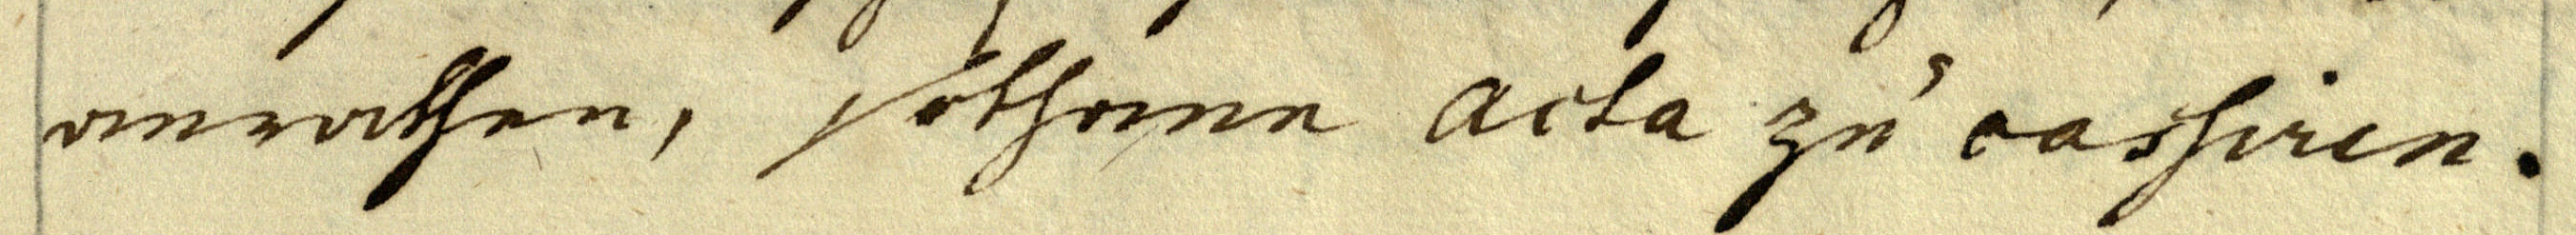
anrathen, sothane acta zu cassiren.
